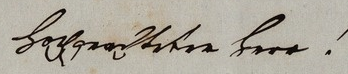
Hochgeachteter Herr!
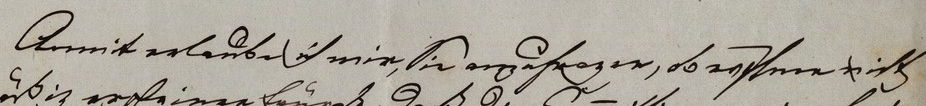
Anmit erlaube ich mir, Sie anzufragen, ob es Ihnen nicht
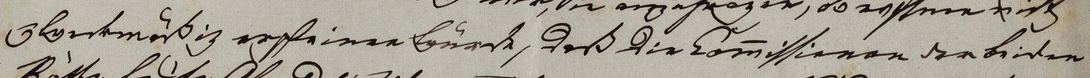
zweckmäßig erscheinen würde, daß die Commissionen der beiden
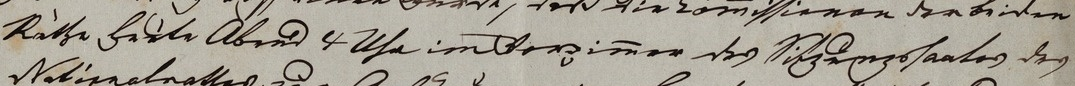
Räthe heute Abend 4 Uhr im Vorzimmer des Sitzungssaales des
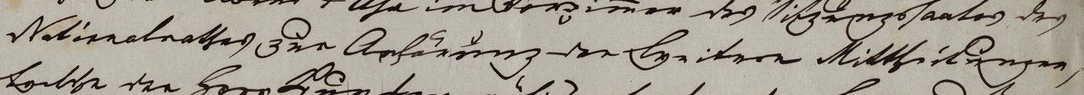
Nationalrathes zur Anhörung der weitern Mittheilungen,
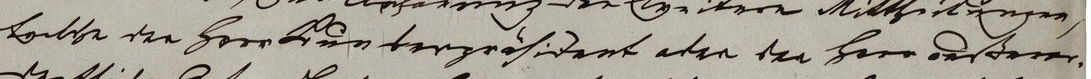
welche der Herr Bundespräsident oder der Herr außeror-
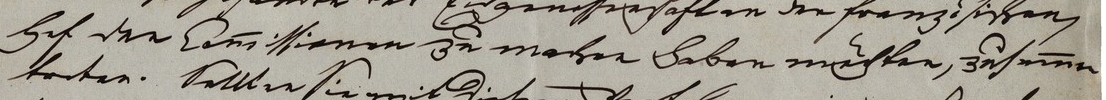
Hof den Commissionen zu machen haben möchten, zusammen
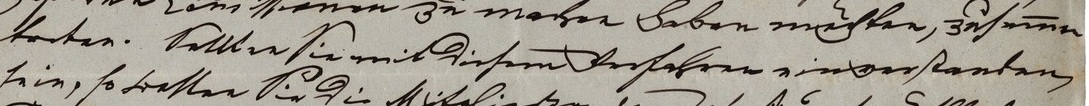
treten. Sollten Sie mit diesem Verfahren einverstanden
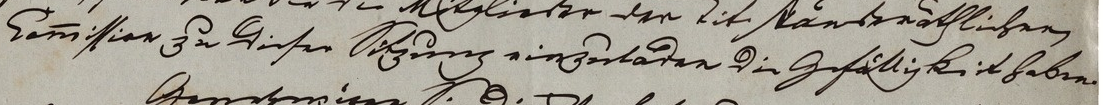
Commission zu dieser Sitzung einzuladen die Gefälligkeit haben.
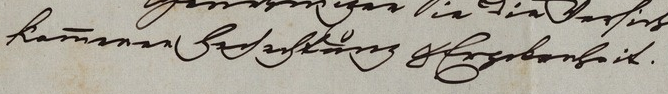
kommenen Hochachtung & Ergebenheit.
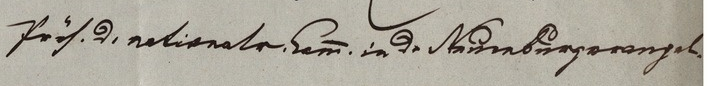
Präs. d. nationalr. Comm. in d. Neuenburgerangel.
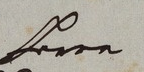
Bern
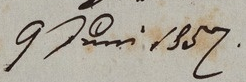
9 Juni 1857.
